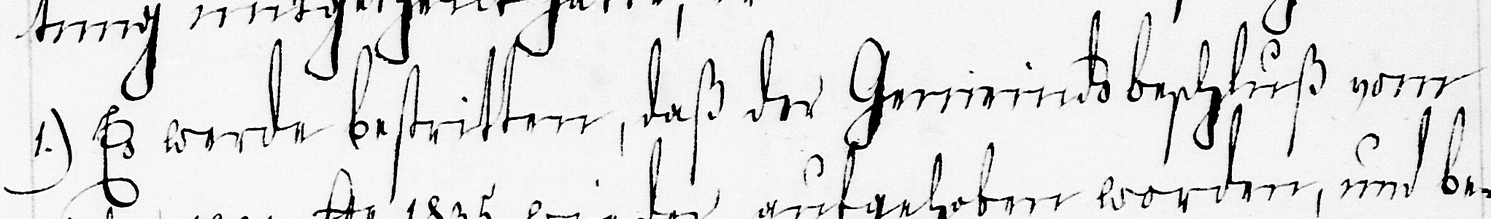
1.) Es werde bestritten, daß der Gemeindsbeschluß vom
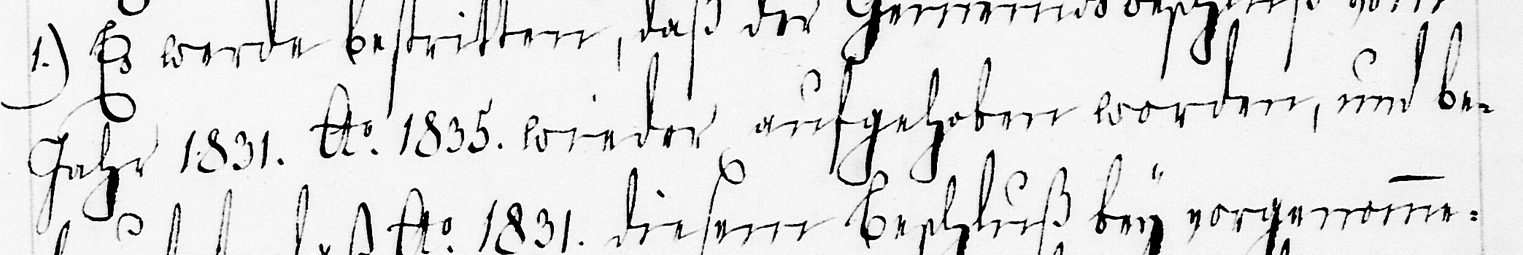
Jahr 1831. Ao. 1835. wieder aufgehoben worden, und be¬
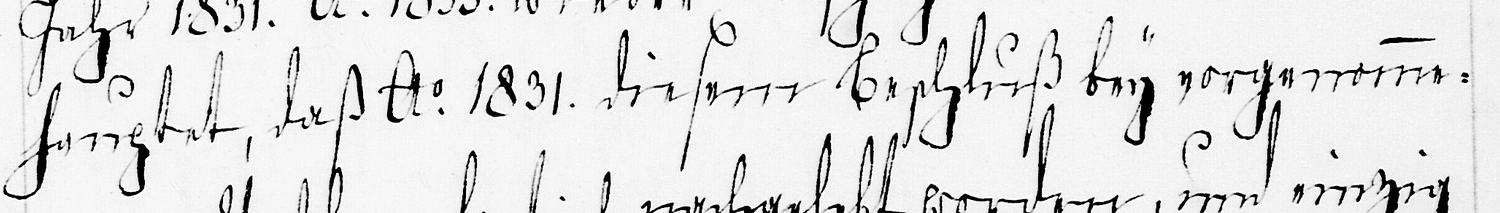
hauptet, daß Ao. 1831. diesen Beschluß bey vorgenomme¬
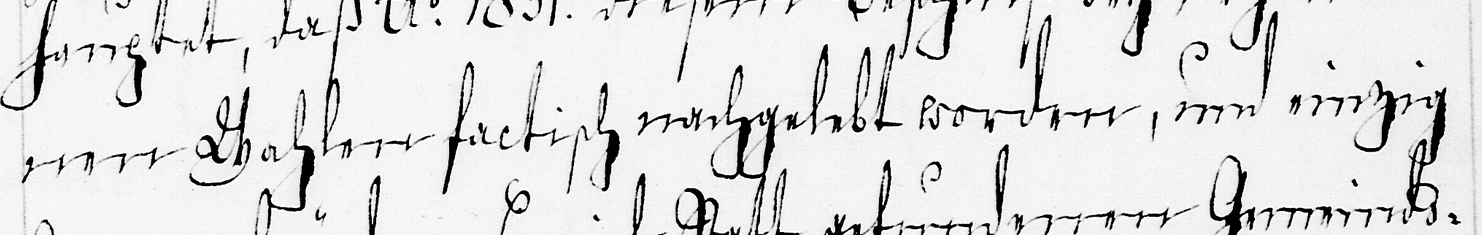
nen Wahlen factisch nachgelebt worden, und einzig
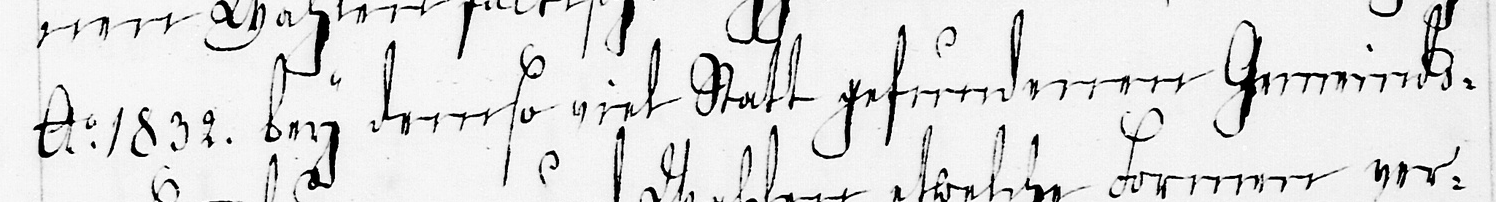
Ao. 1832. bey dem so viel Statt gefundenen Gemeinds¬
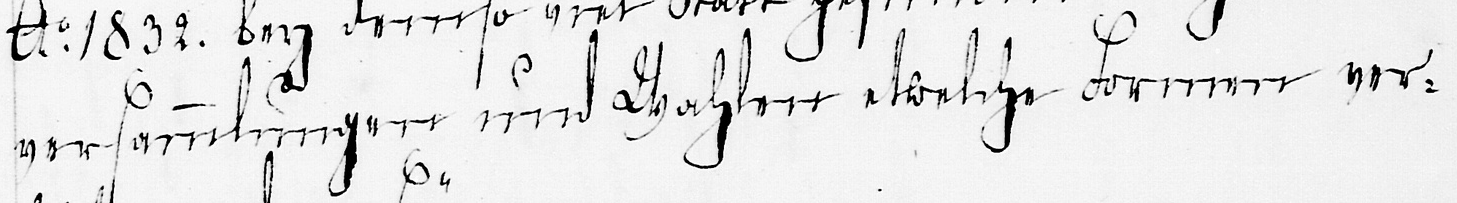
versammlungen und Wahlen etwelche Formen ver¬
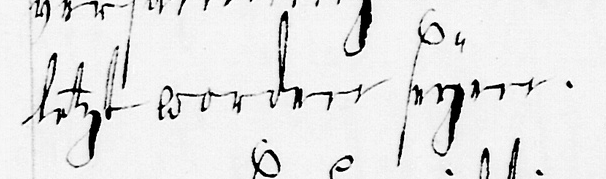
letzt worden seyen.
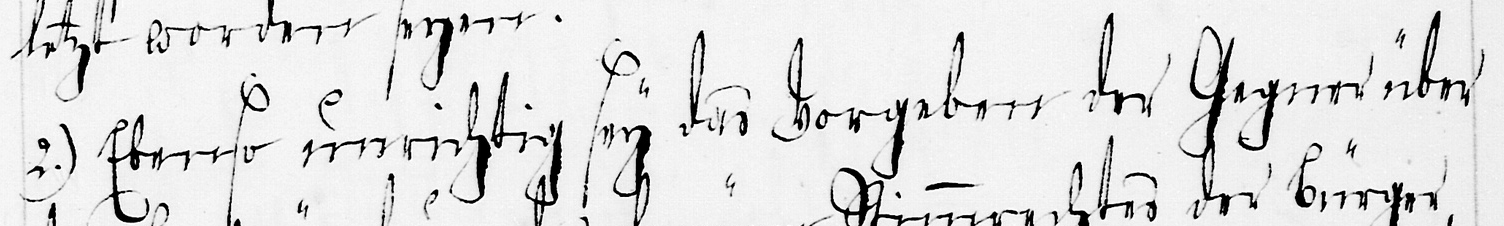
2.) Ebenso unrichtig sey das Vorgeben der Gegner über
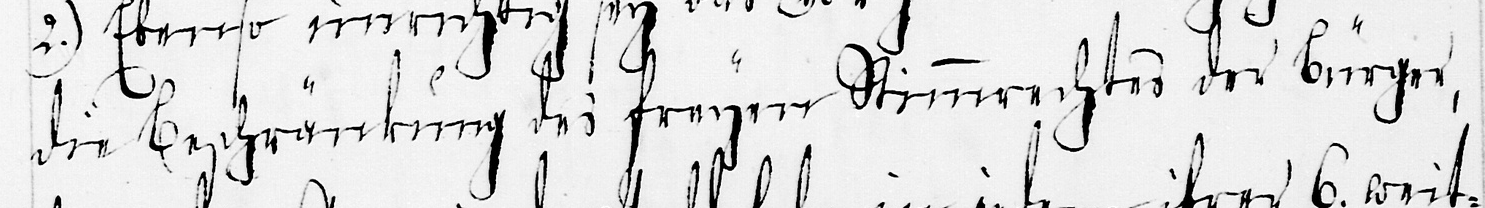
die Beschränkung des freyen Stimmrechtes der Bürger,
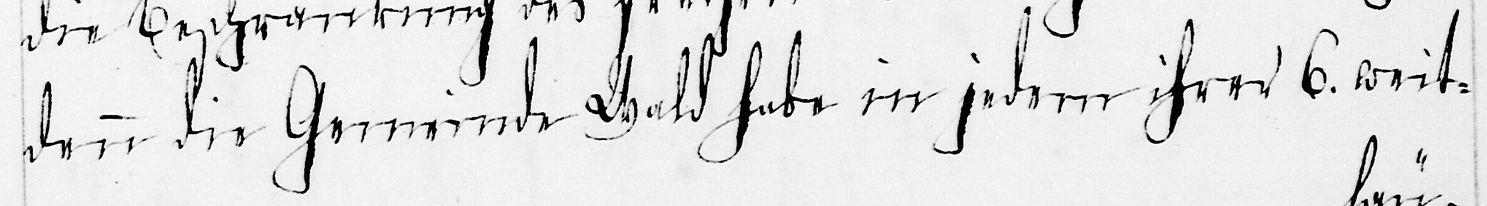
denn die Gemeinde Wald habe in jedem ihrer 6. weit-
